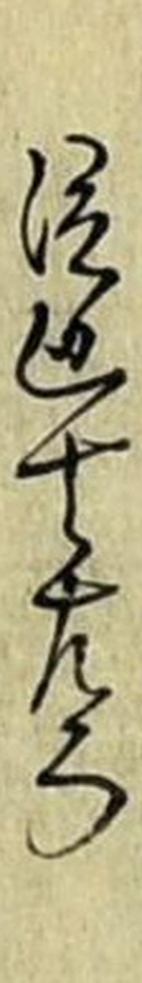渡辺十郎左衛門
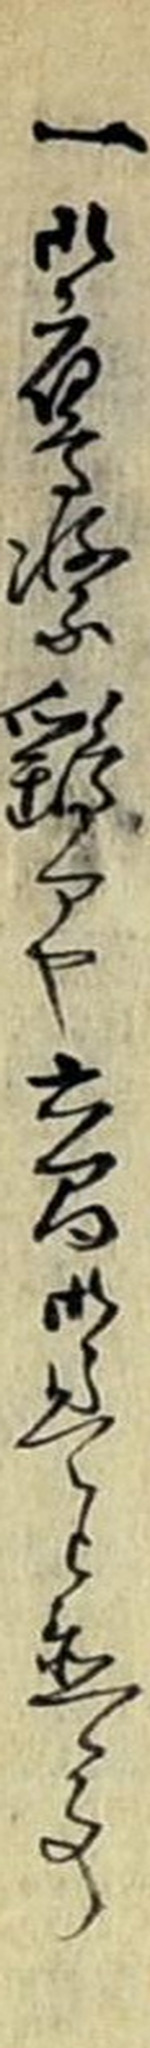一御鷹繋鶏部屋六間御畳被置候事
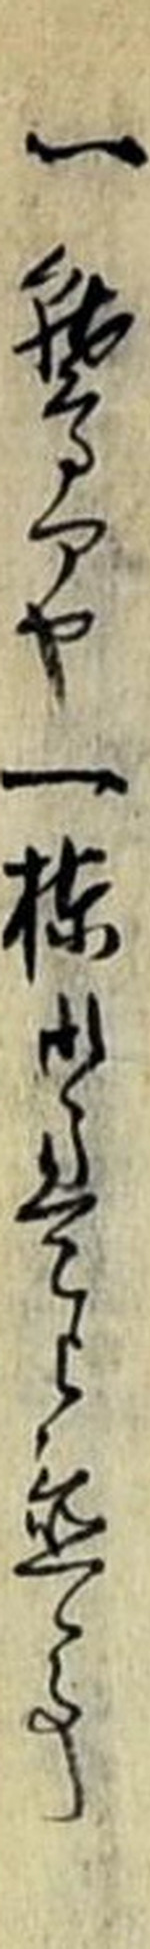一鷲部屋一棟御畳被置候事
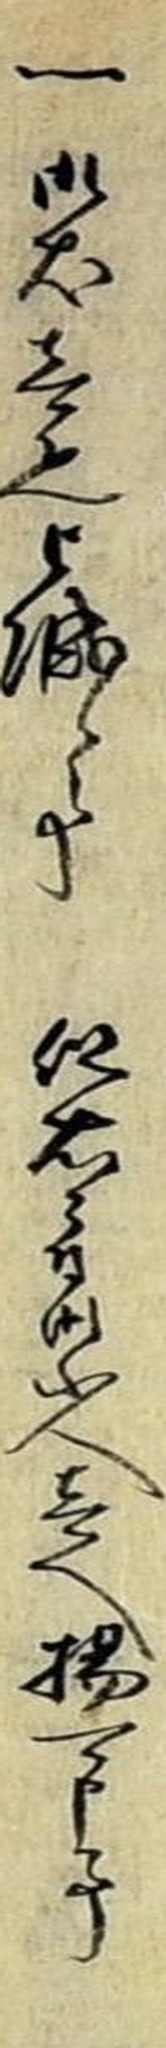一御犬壱疋被減候事但右ニ付御小人壱人揚可申事
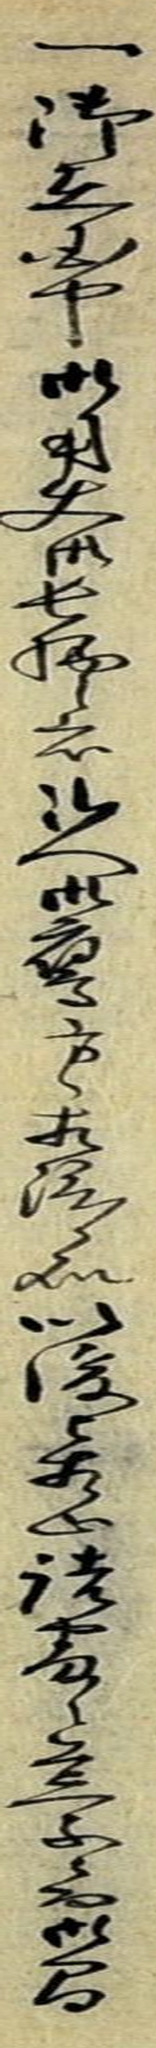一御在国中御用使於御長柄之者弐人御鷹方へ相渡候処以後被相止諸番之荒子ニ而御間
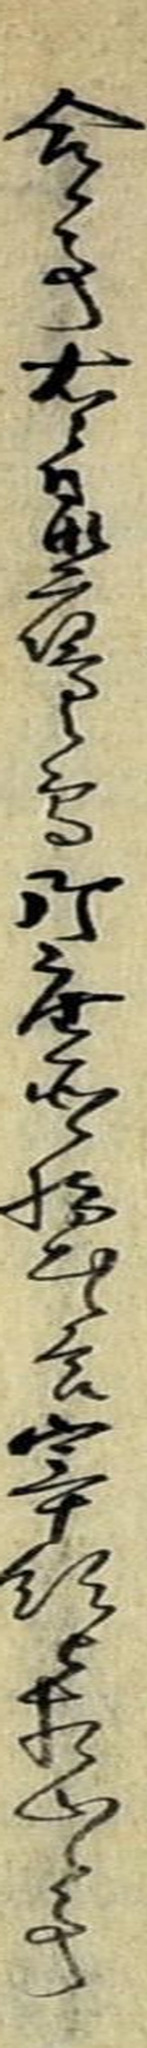合候事右ニ付御鷹之鳥御座所へ指出候節宰領被相止候事
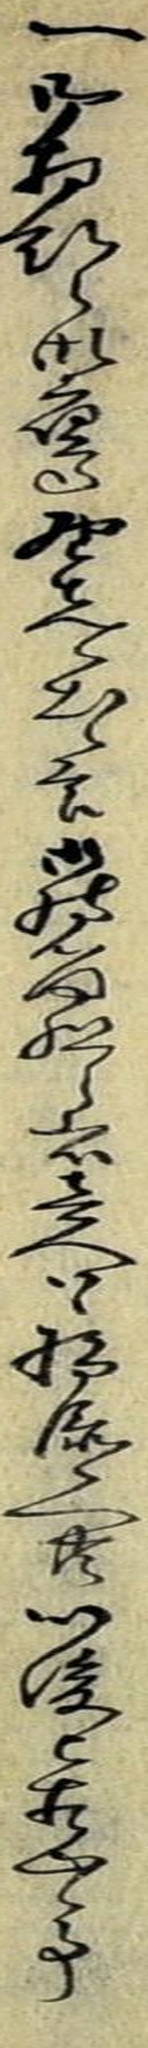一御拝領之御鷹野先へ出候節御持筒組之者壱人ツヽ指添候へ共以後被相止候事
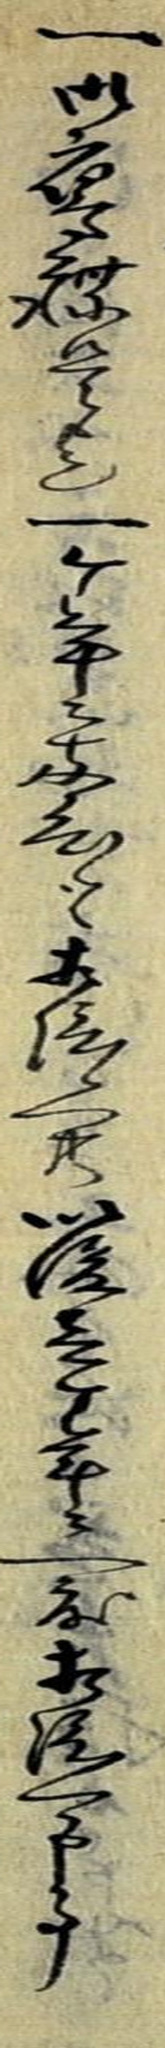一御鷹鞢是迄一ケ年ニ両度ツヽ相渡候へ共以後壱ケ年ニ一度相渡可申事
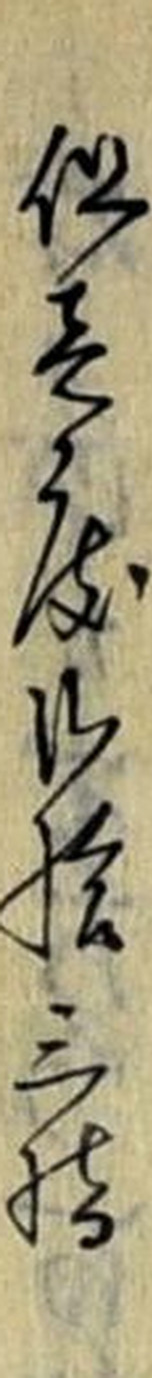但壱度弐拾三指
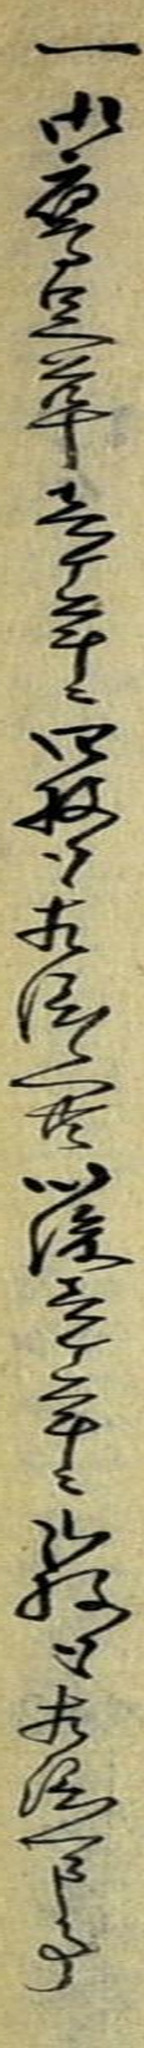一御鷹足革壱ケ年ニ四枚ツヽ相渡候へ共以後壱ケ年ニ弐枚ツヽ相渡可申事
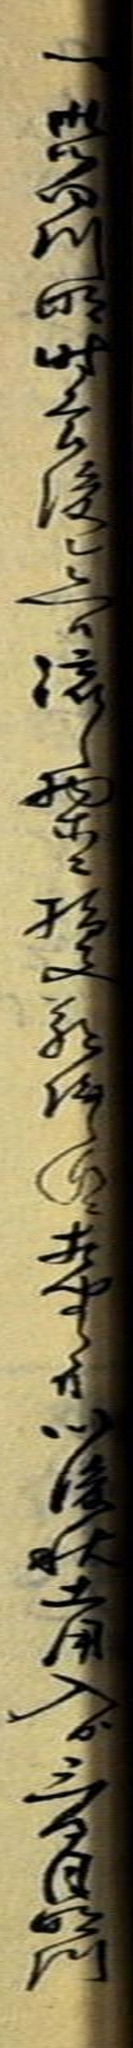一御留川明時節後レ候ヘハ流し物等ニ指支難儀之趣ニ相聞候ニ付以後秋土用入ゟ三か月明川
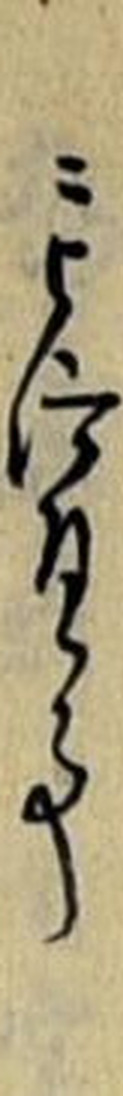ニ被仰付候事
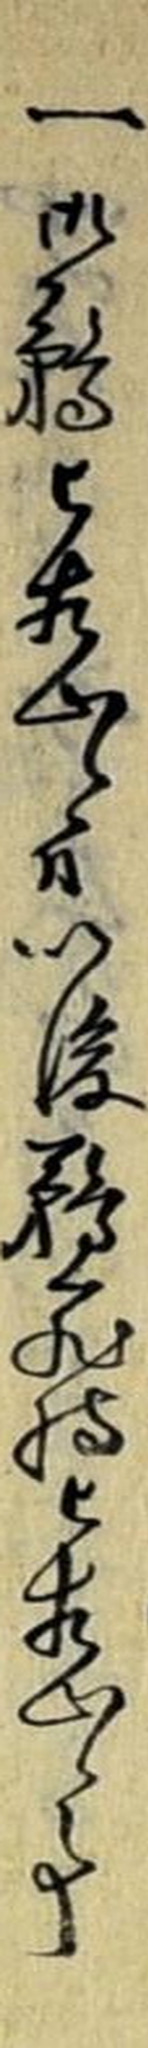一御鵜被相止候ニ付以後鵜蔵場被相止候事
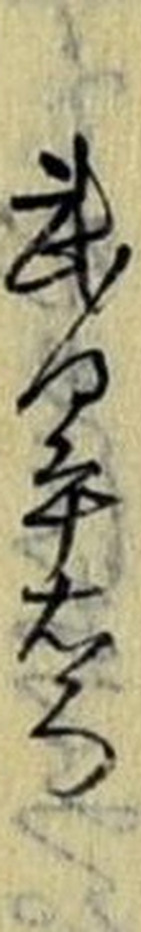武田平右衛門
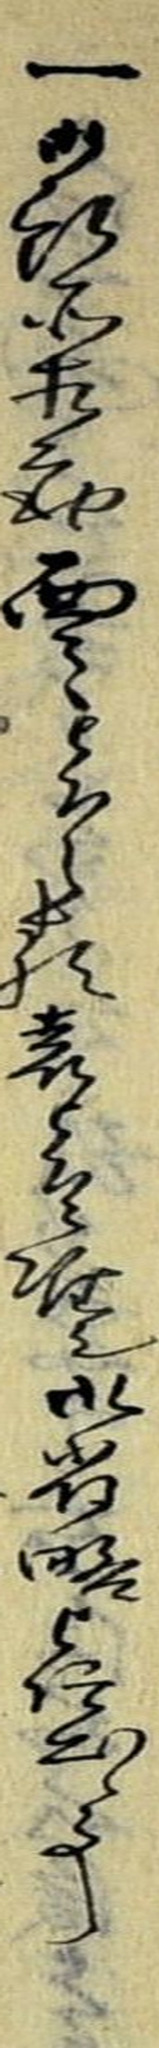一御預所相勤面々へ被下之類表被下ニ准シ御省略被仰出候事
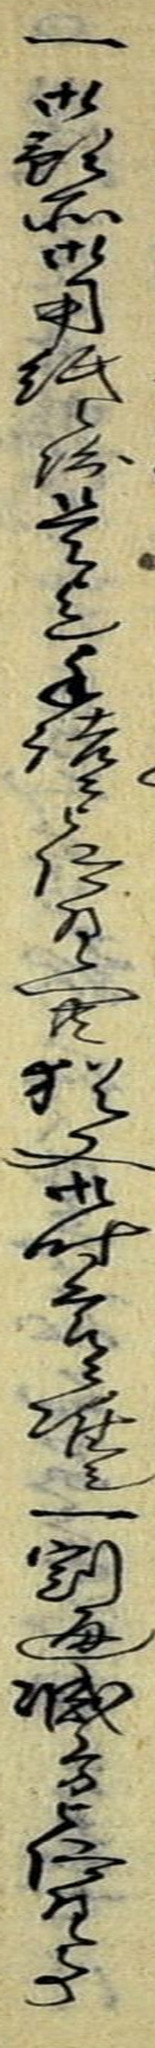一御預所御用紙之儀是迄手詰ニ被仰付候へ共猶又御時節ニ准シ一割通減方被仰付候事
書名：命令之部 三
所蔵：福井県文書館 Fukui Prefectural Archives
